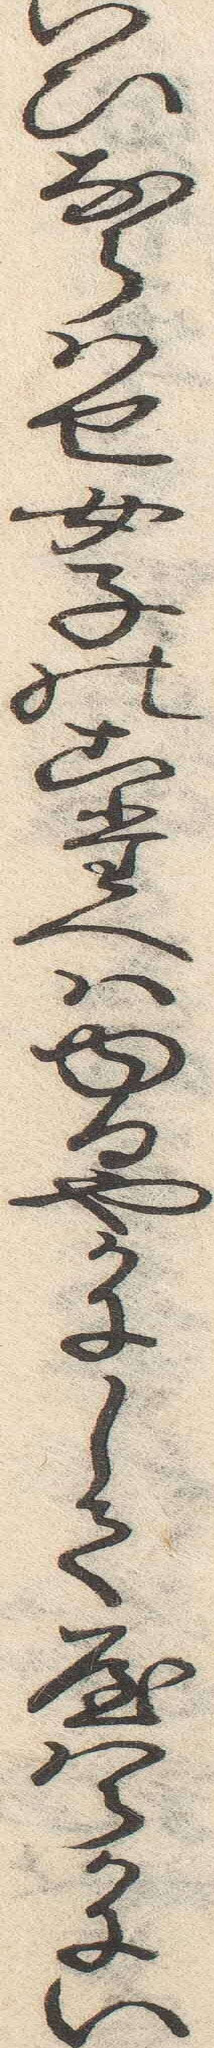いひならはせ女子のこたへはゆるやかにしてやはらかにい
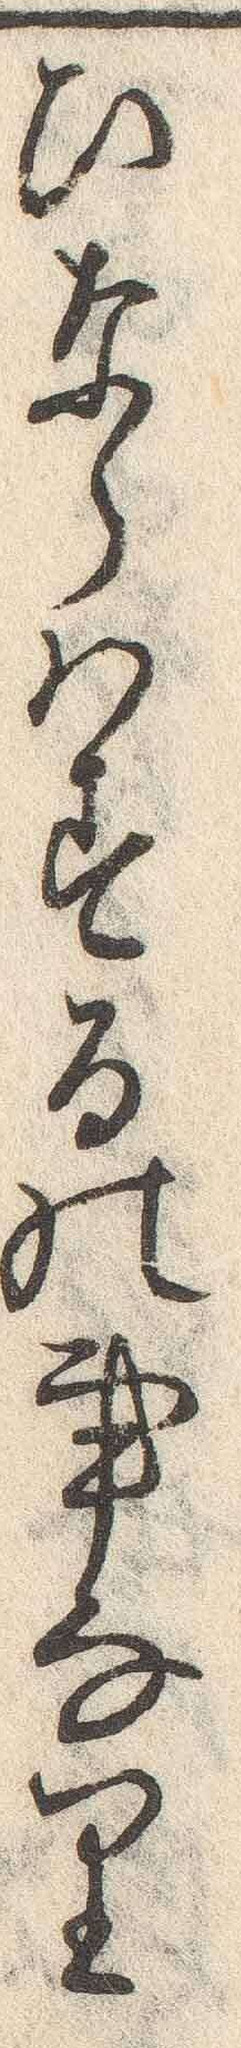ひならはするの事なり
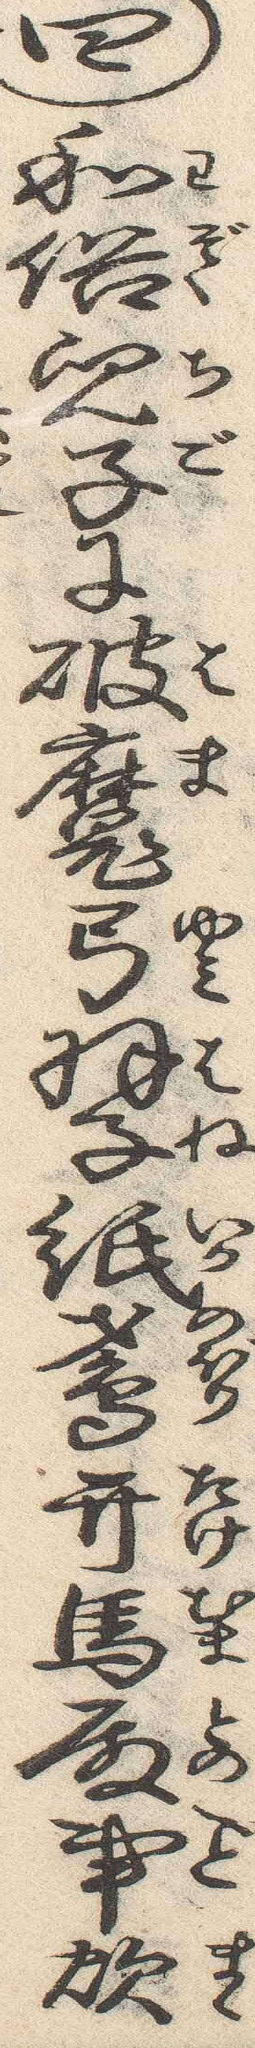㊃和俗児子に破魔弓羽子紙鳶竹馬殿事炊
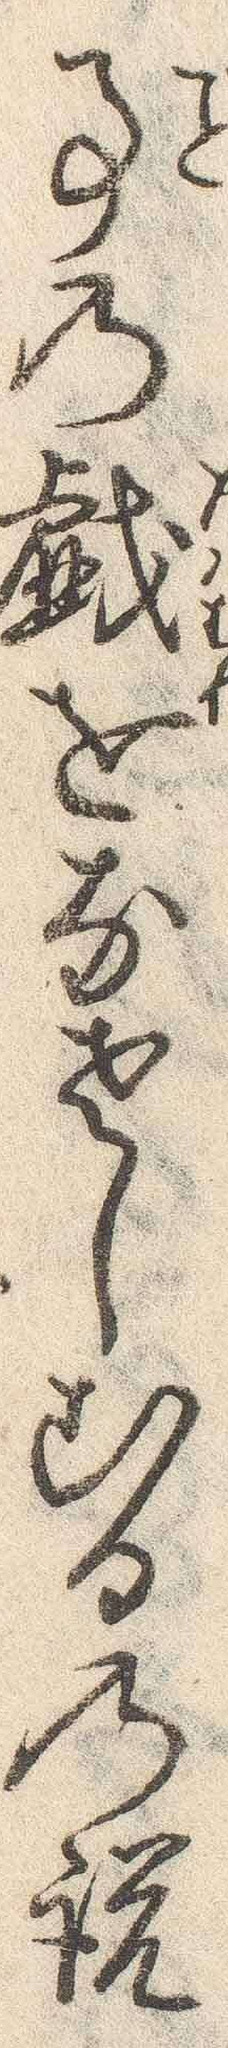事の戯をなさしむるの説
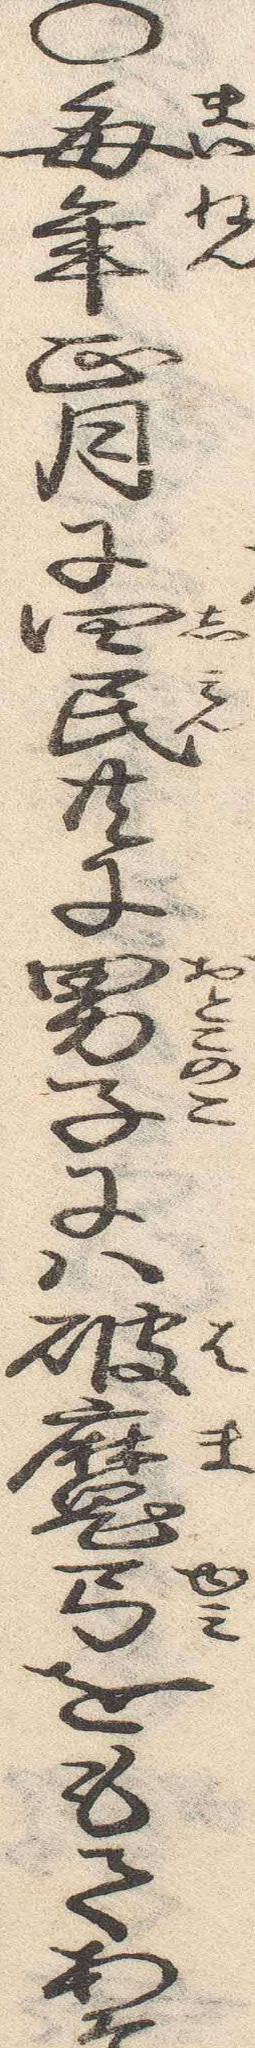○毎年正月に四民共に男子には破魔弓をもてあそ
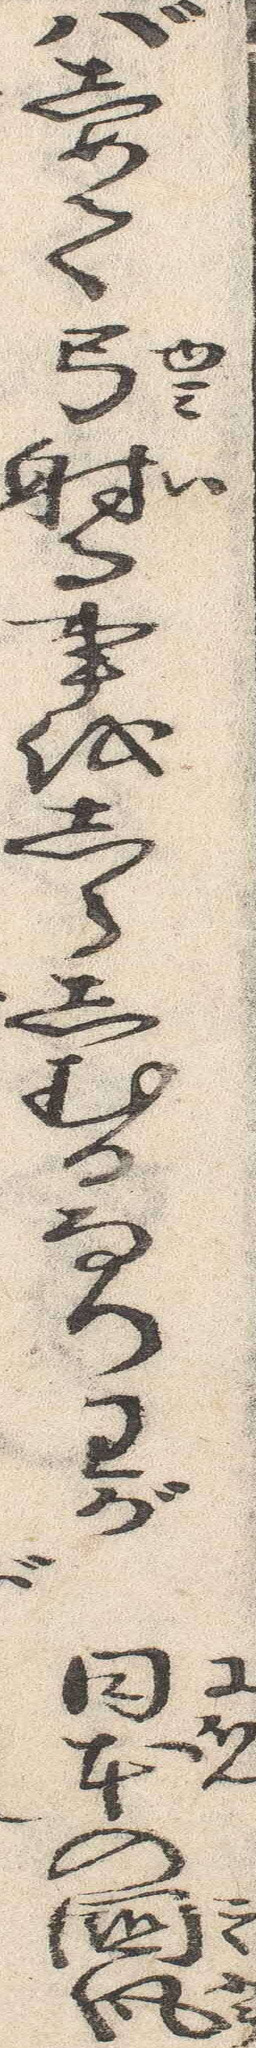ばしめて弓射る事をしらしむるなりわが日本の国風
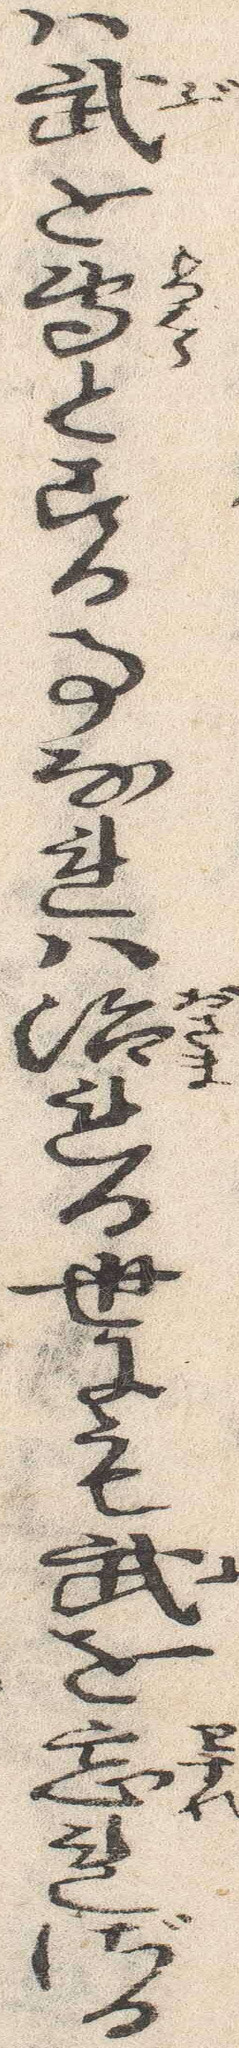は武を専とする事なれは治れる世にも武を忘れざる
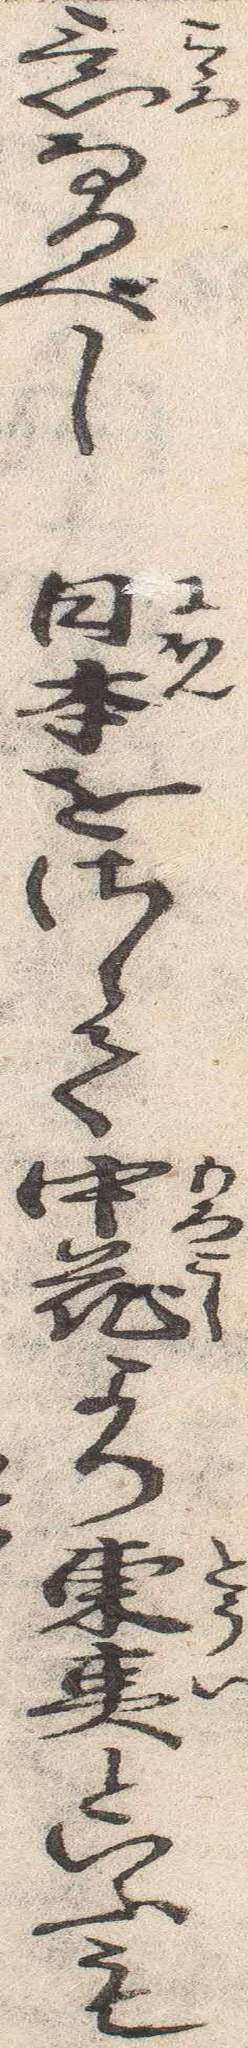意なるべし日本をさして中花より東夷といふも
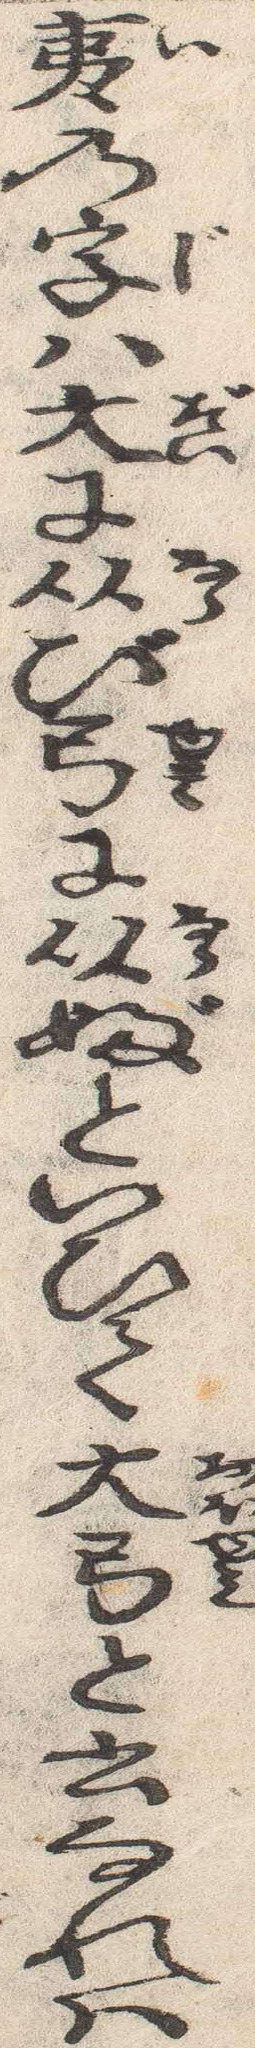夷の字は大に从び弓に从ぶといひて大弓と書なれは
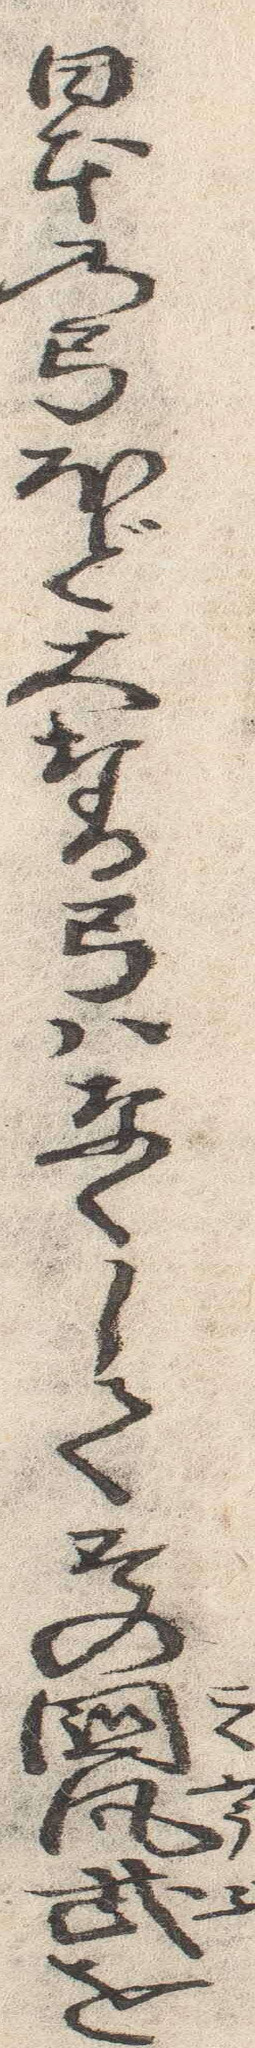日本の弓ほど大なる弓はなくしてその国風武を
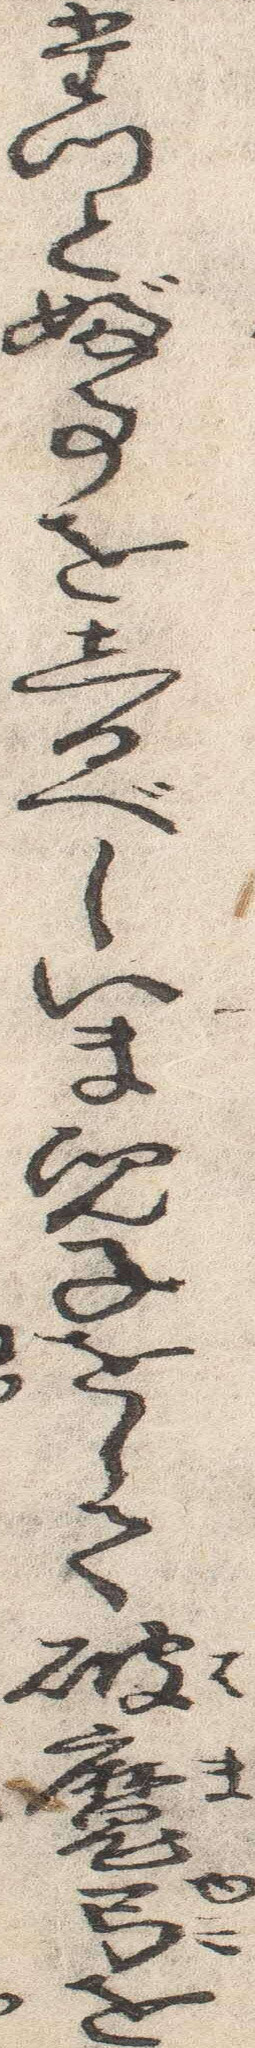たつとぶ事をしるべしいま児子をして破魔弓を
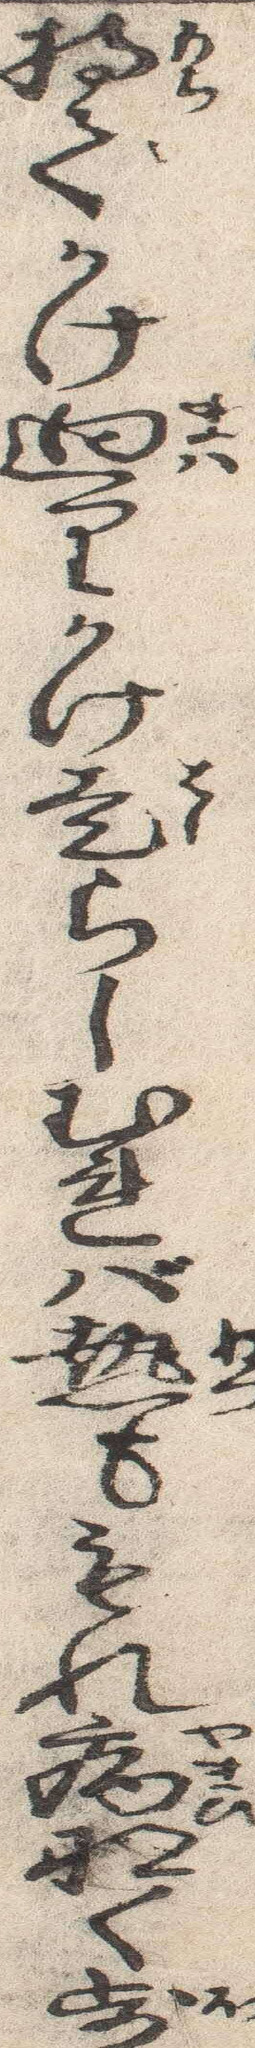持てかけ廻りかけ走らしむれば熱ももれ病なく歩
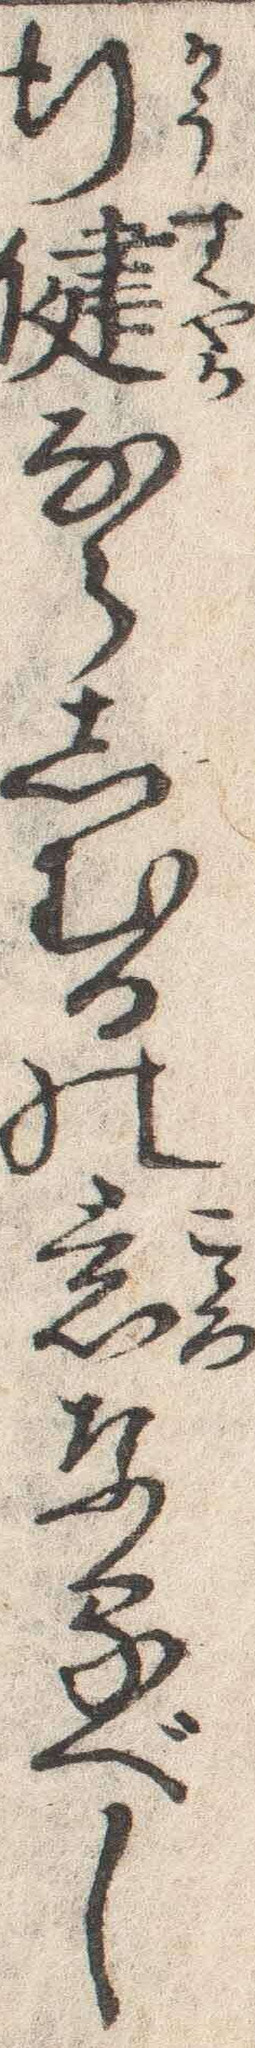行健ならしむるの意なるべし
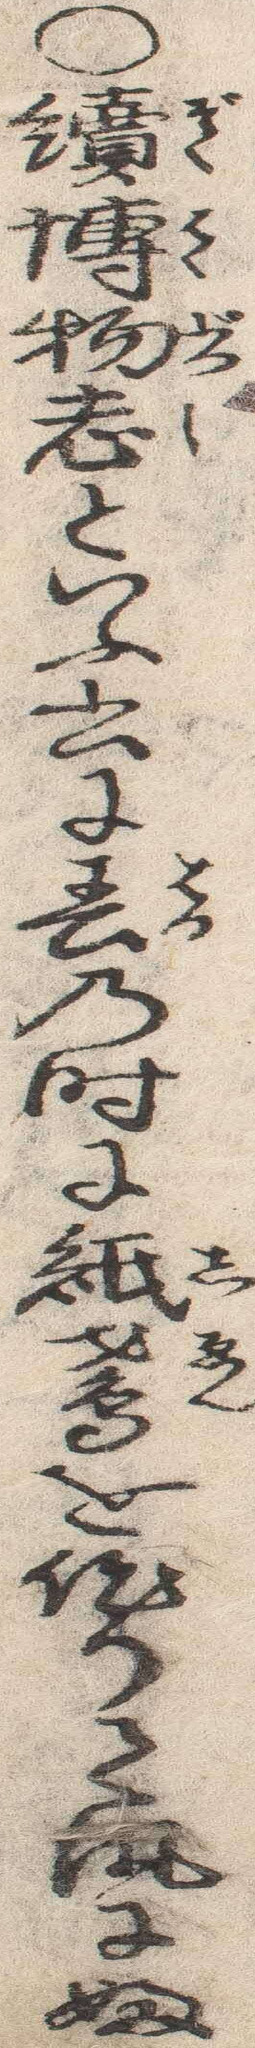○続博物志といふ書に春の時に紙鳶を作りて風にふ
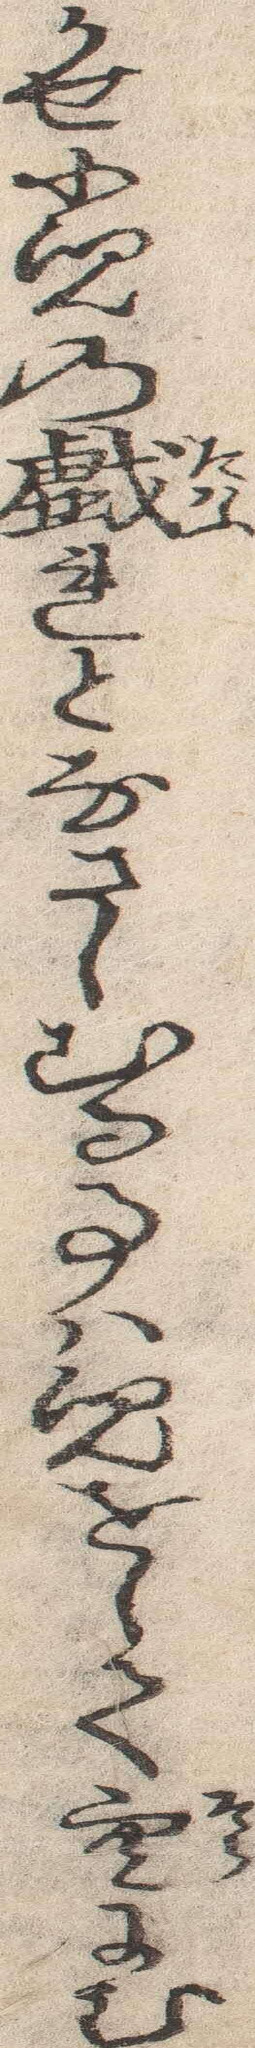かせ小児の戯れとなさしむる事は児をして空にむ
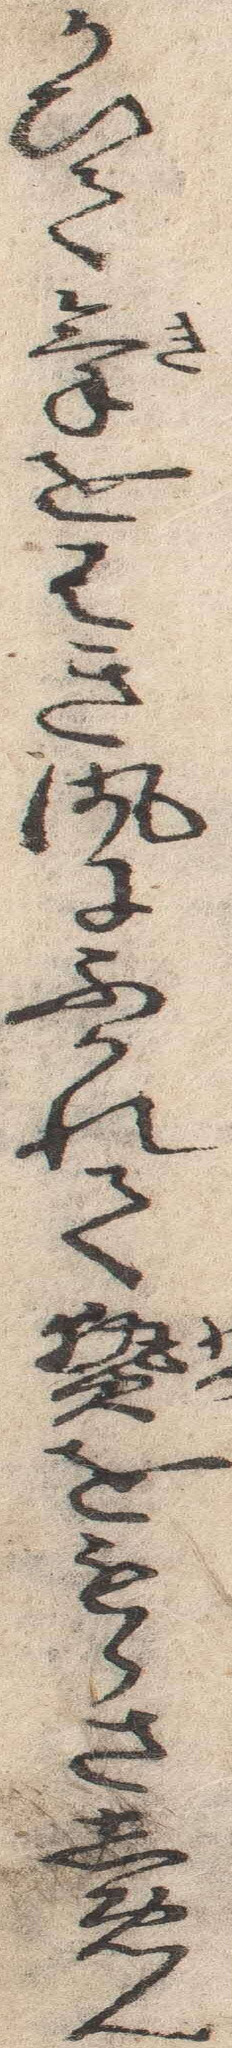かひて気をはき風にふかれて熱をもらさしめん
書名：小児必用養育草
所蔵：東京学芸大学附属図書館 国文学研究資料館
